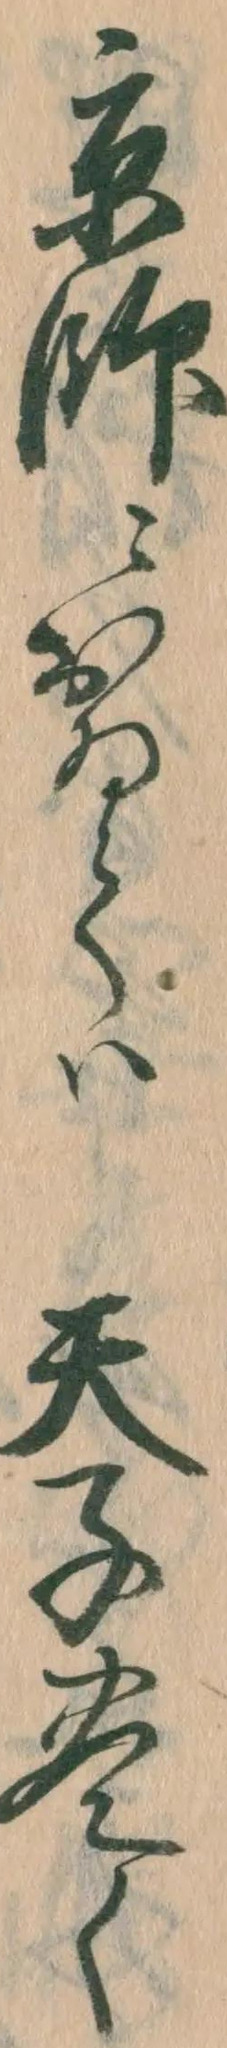京師ニおゐてハ天子盡く
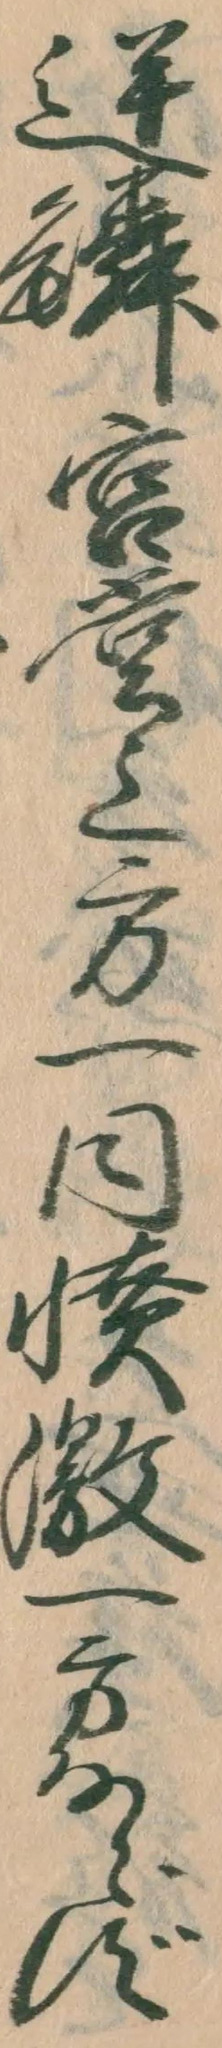逆鱗宮堂上之方一同憤激一方ならず
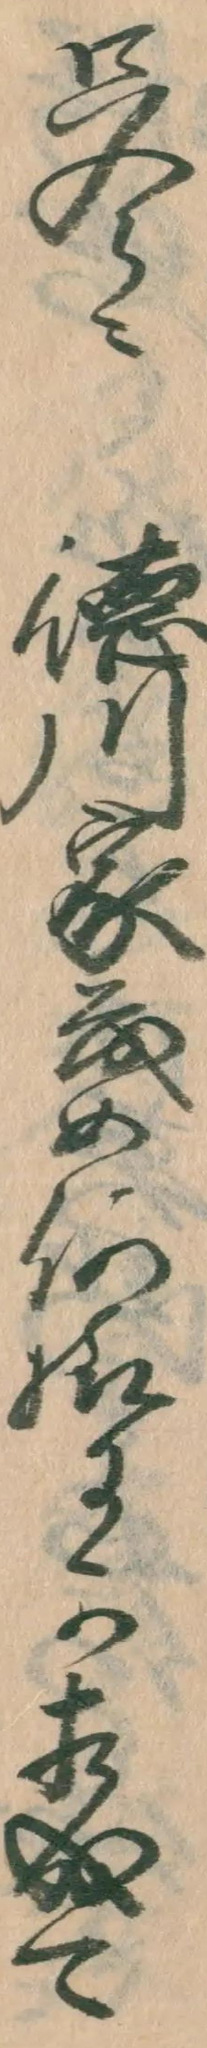只今ニ徳川家も如何様に可相成可
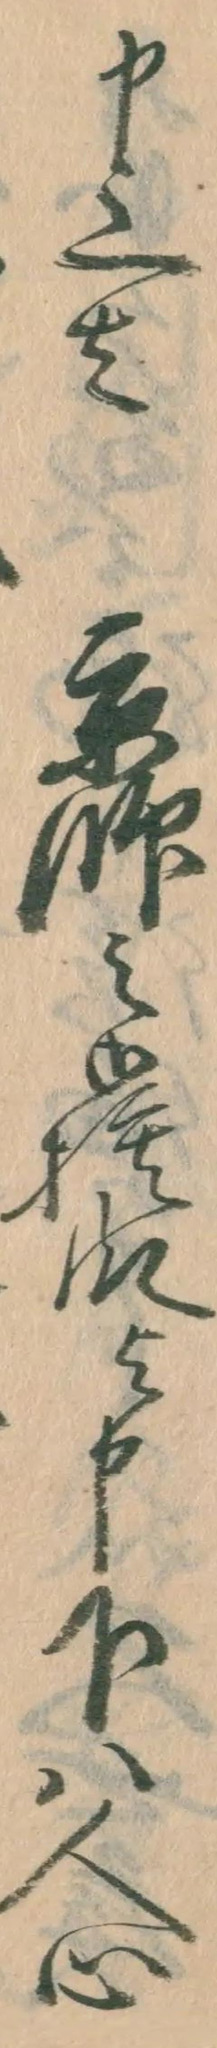申上者京師之御模様と申下ハ人心
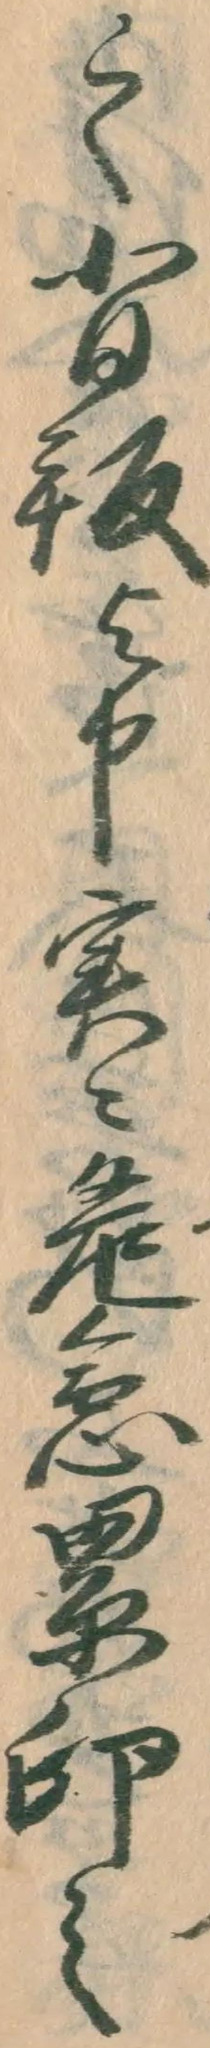之背叛と申実ニ危急累卵之

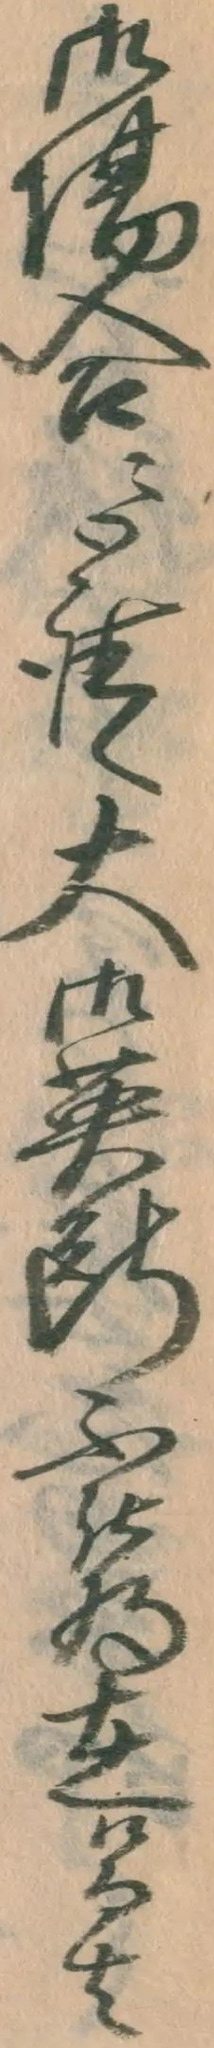御場合ニ御座候大御英断不被為在候而者
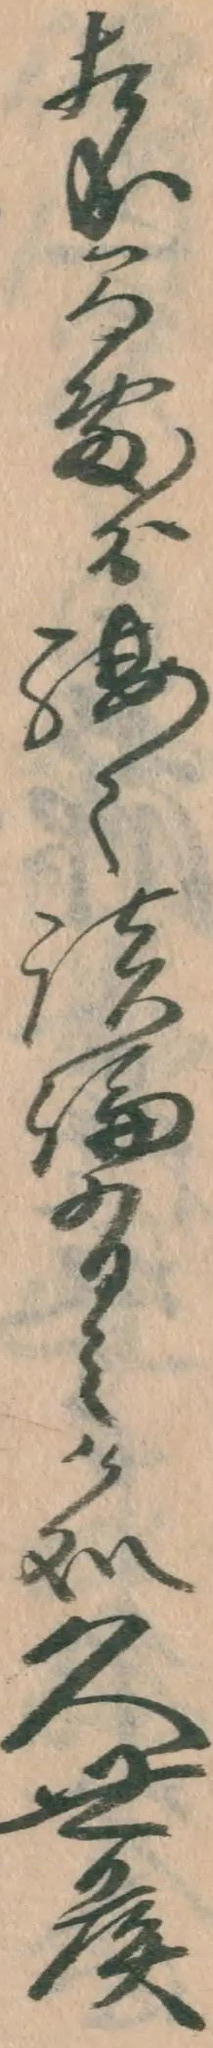相成間敷旨縷々談論有之候処久世侯
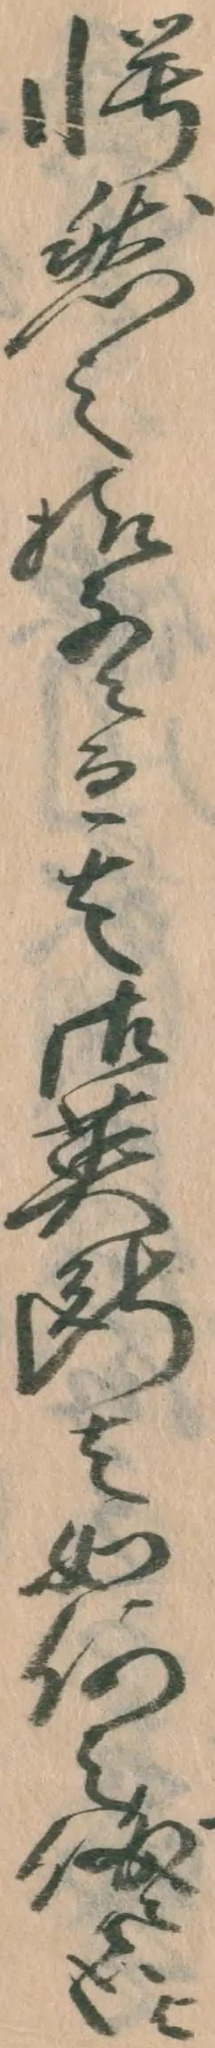愕然之様子ニ而其御英断者如何之儀ニ候哉と
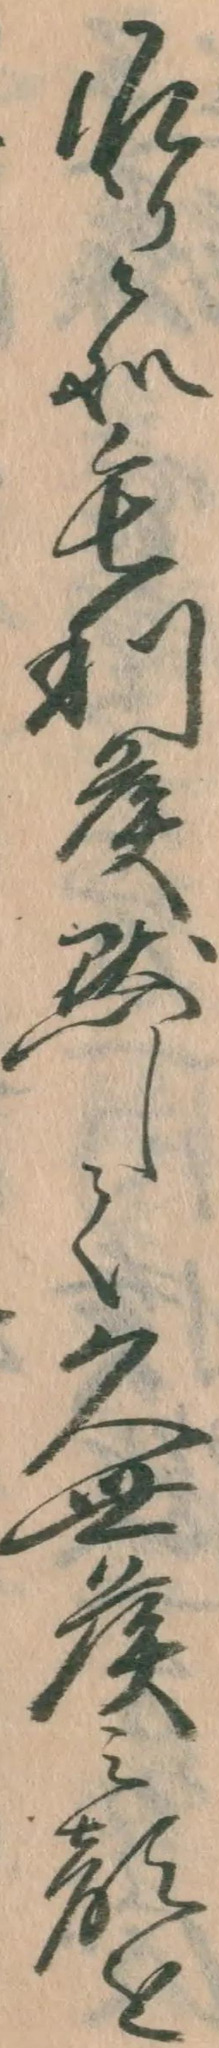承り候処毛利侯黙して久世侯之顔を
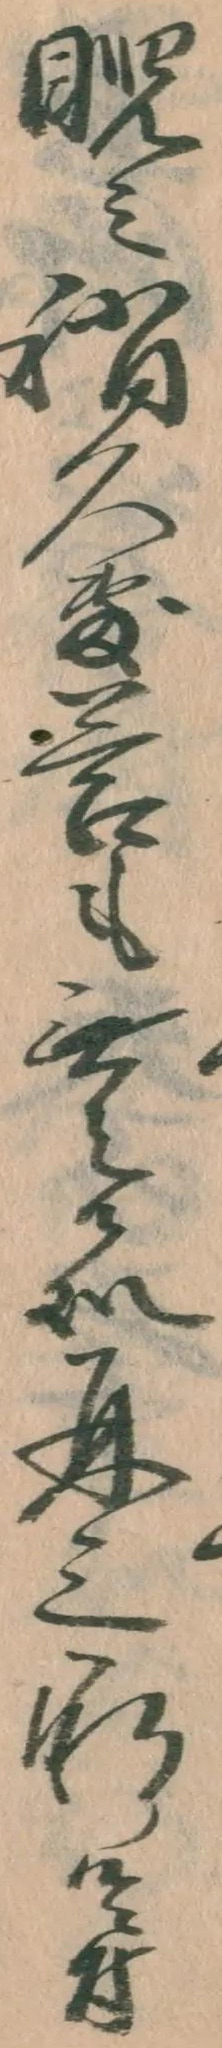睨ミ稍久敷答も無之候処再三承り候ニ付
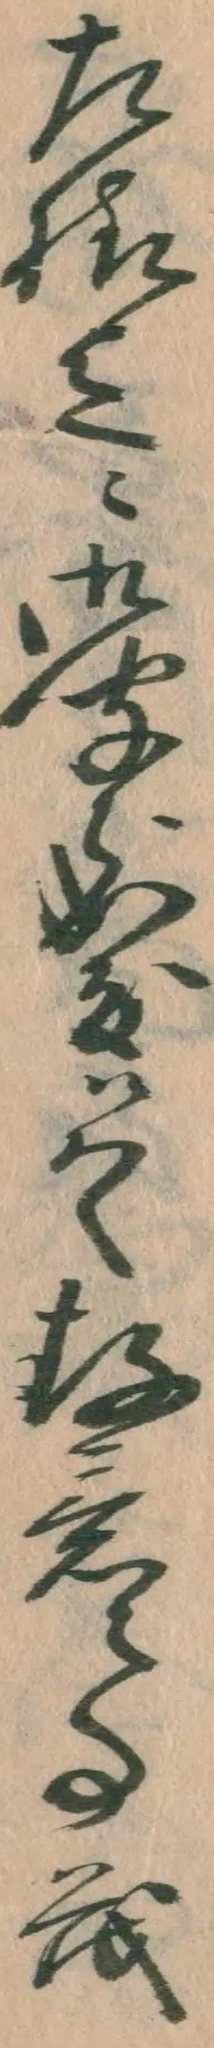左様迄ニ御聞被成度候ハゝ存意之事も
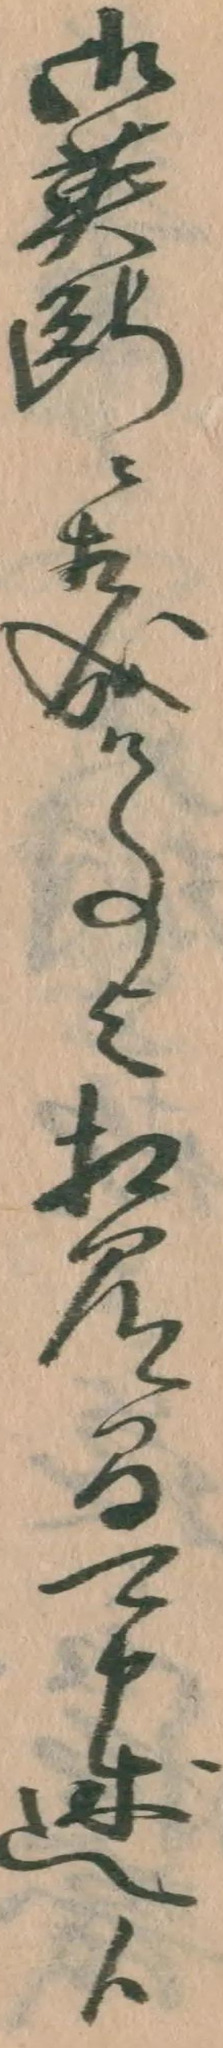御英断ニ相成候事と相見候間可申述候
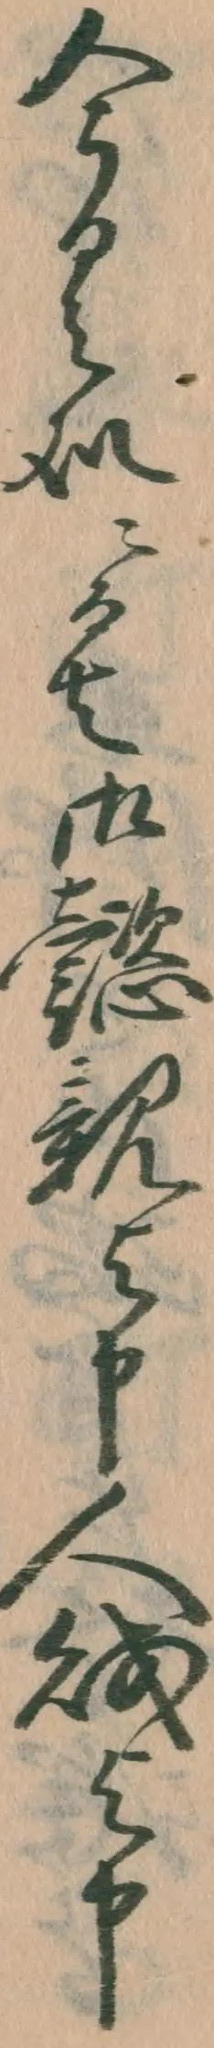今日之処ニ而者御懿親と申人財と申
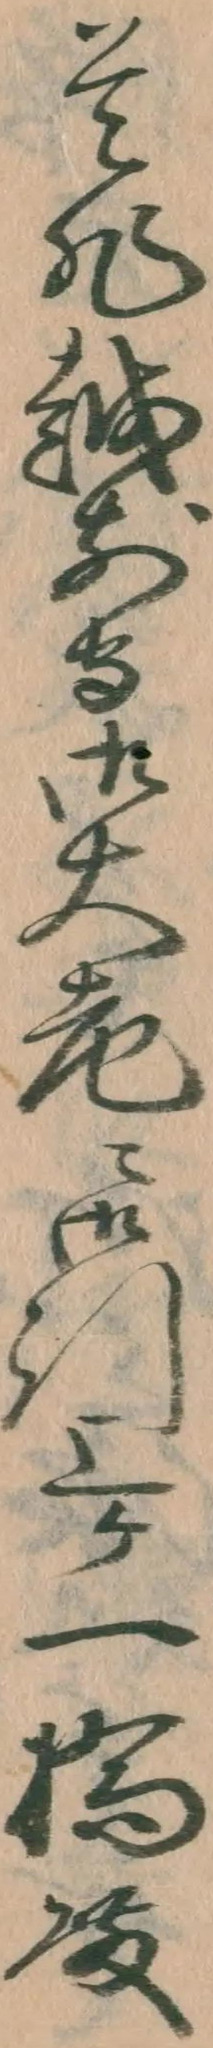是非越前守御大老ニ御引上ケ一橋殿
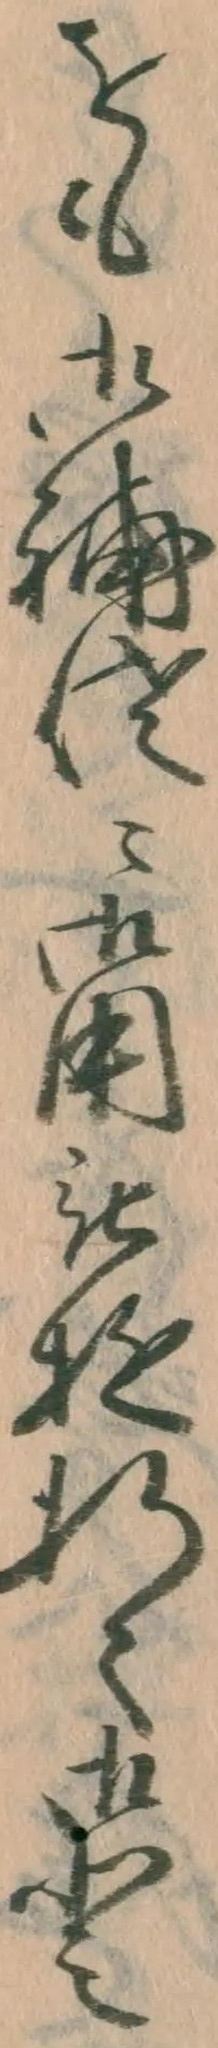をも御補佐ニ御用被遊折々御登
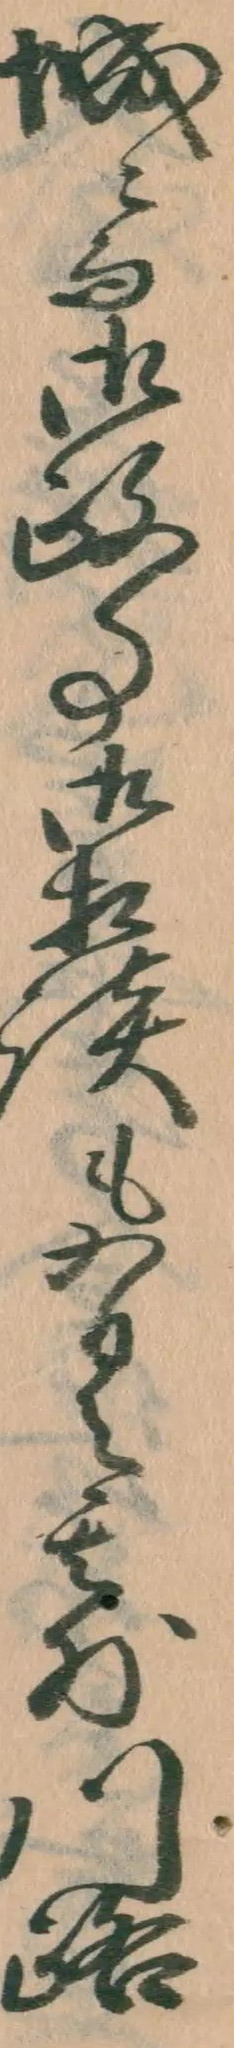城ニ而御政事御相談も有之其外川路
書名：麗斎叢書. 20
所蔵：国立国会図書館 National Diet Library, JAPAN
